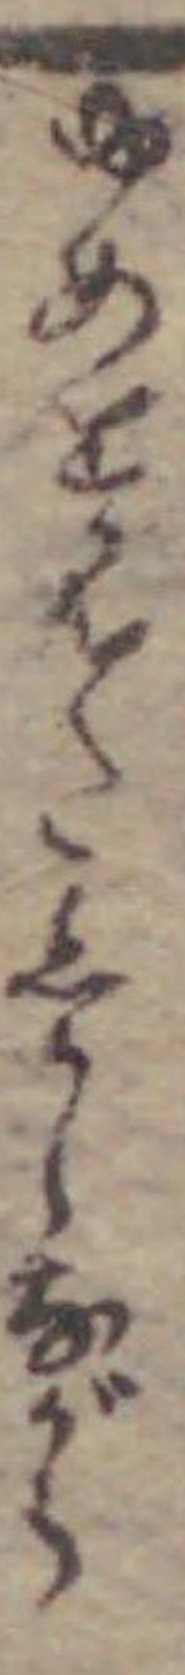ゆめをみたしかしながら
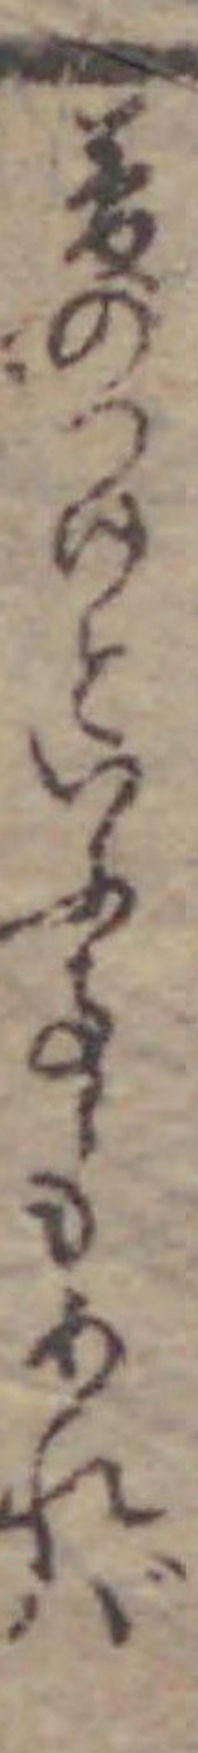夢のつけといふ事もあれば
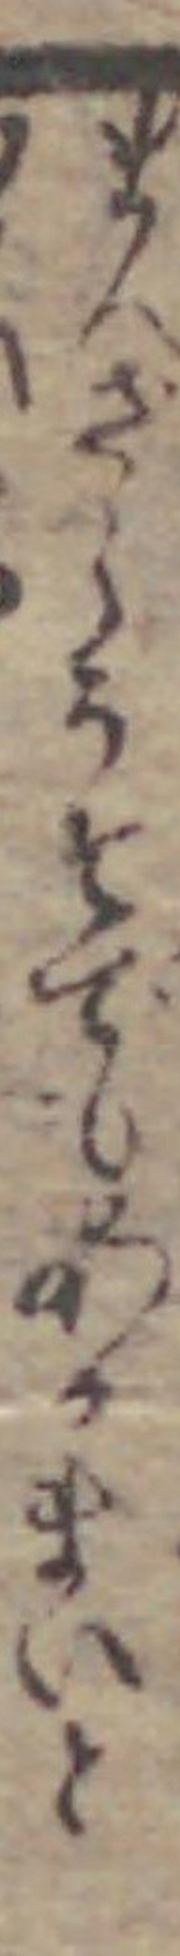まんざらうそでもあかまいと
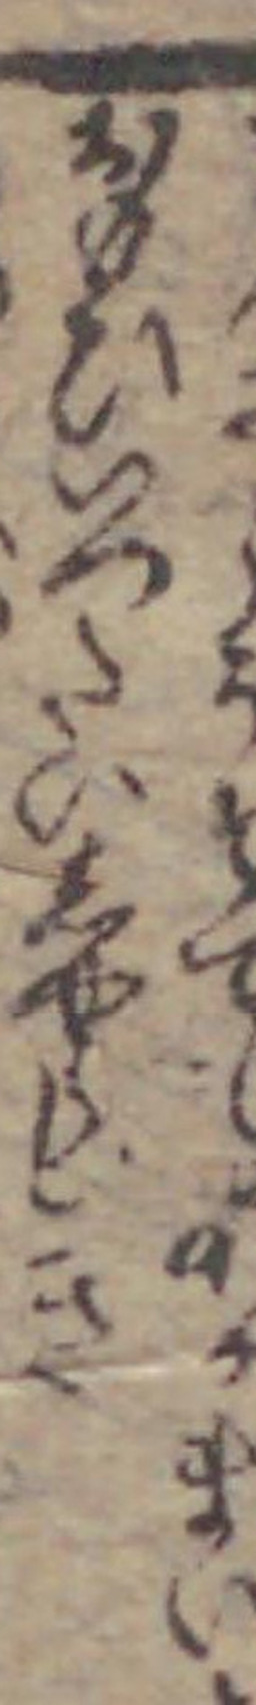おもひいつたいしゃうしき
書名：談芭菰誉詞 : 3巻
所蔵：国立国会図書館 National Diet Library, JAPAN
